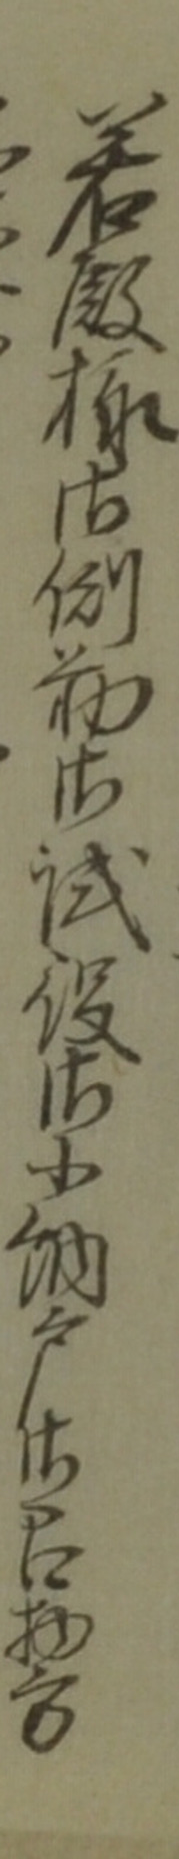若殿様御側勤御試役御小納戸御召物方
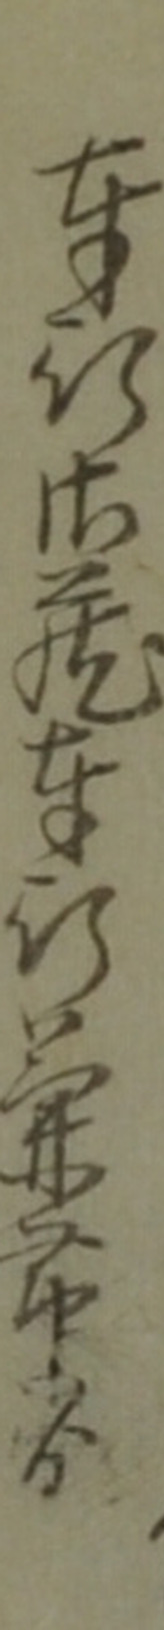奉行御蔵奉行兼帯ゟ
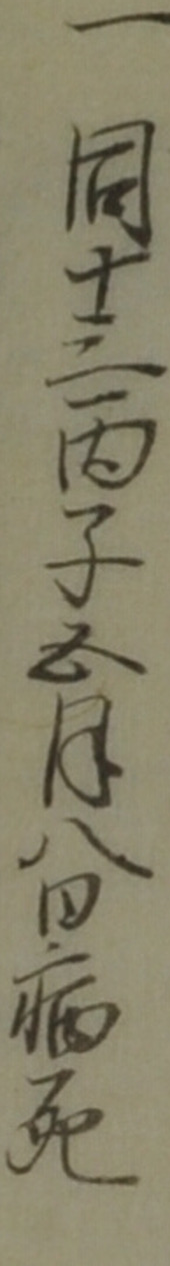一同十三丙子五月八日病死
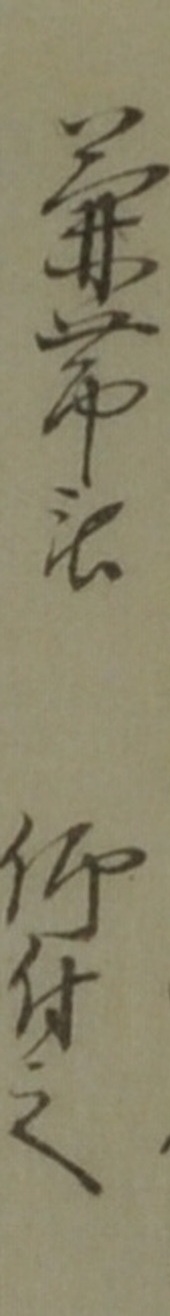兼帯被仰付之
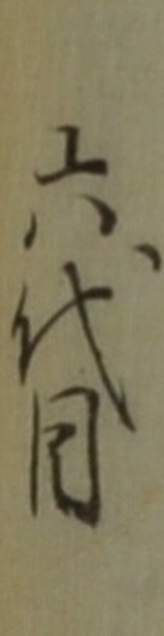六代目
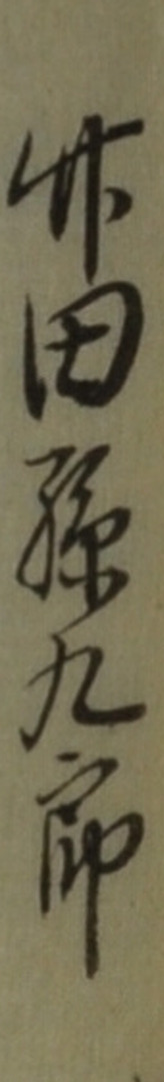竹田孫九郎
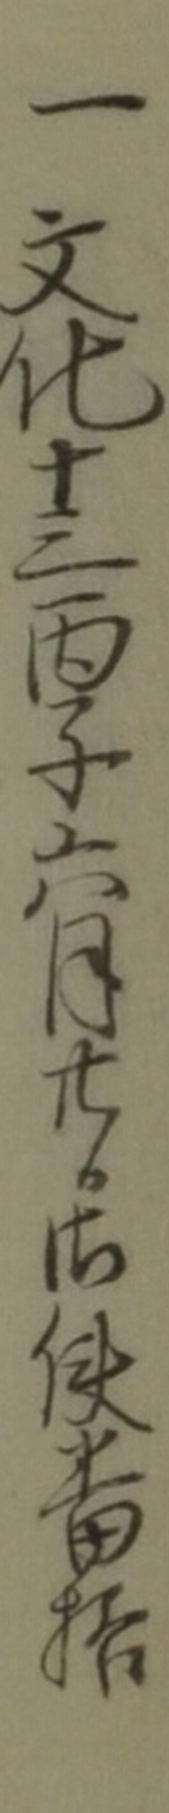一文化十三丙子六月廿日御使番格
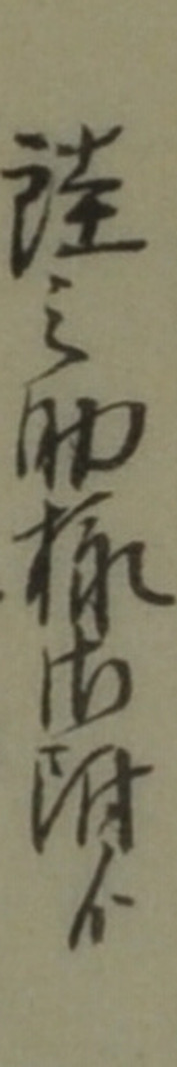詿之助様御附ゟ
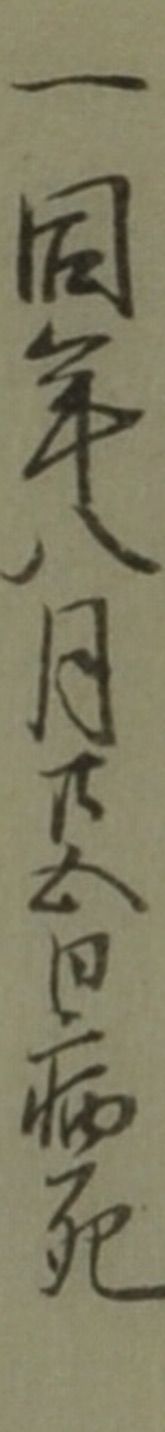一同年八月廿五日病死
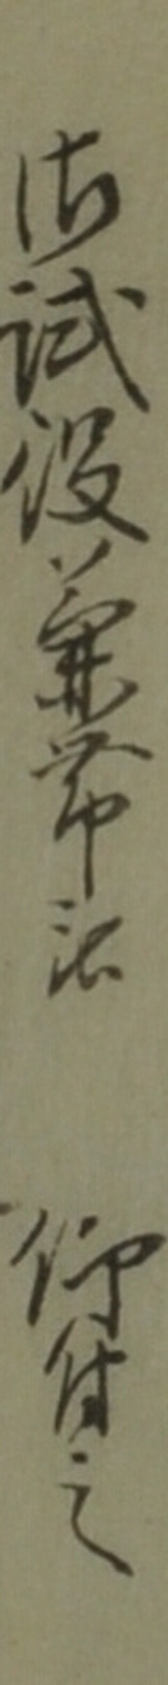御試役兼帯被仰付之
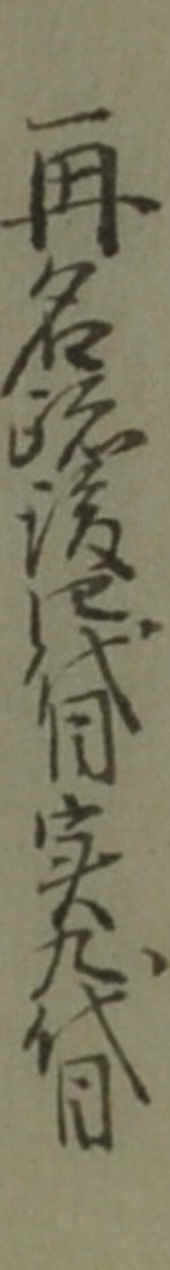再名跡後四代目実九代目
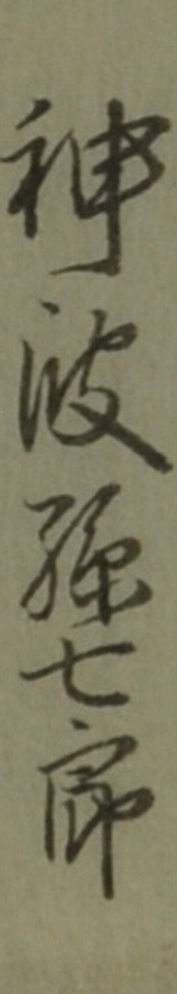神波孫七郎
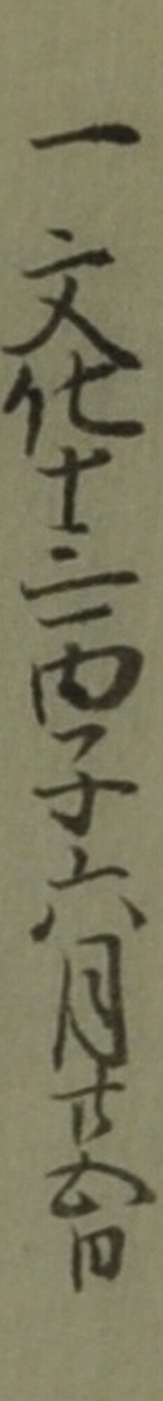一文化十三丙子六月廿五日
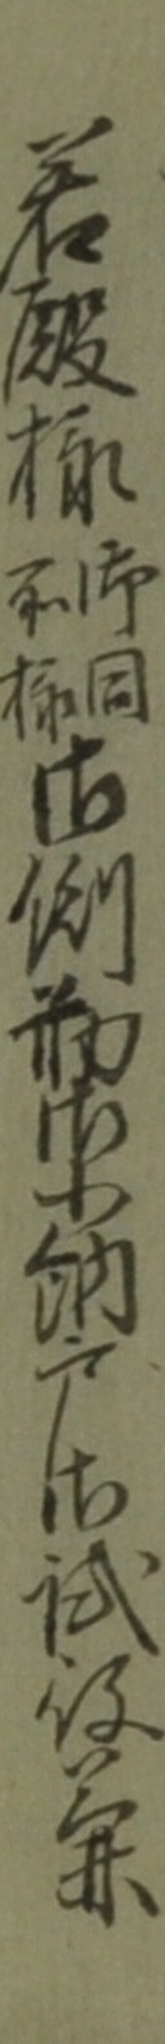若殿様御同所様御側勤御小納戸御試役兼
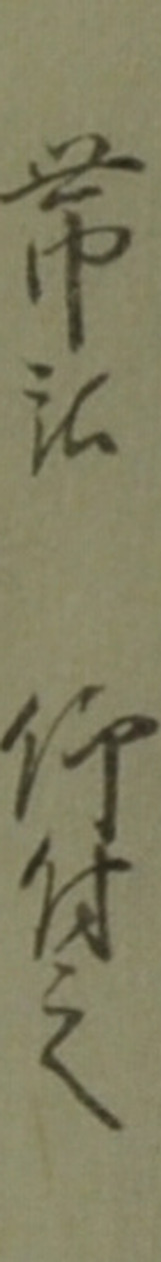兼帯被仰付之
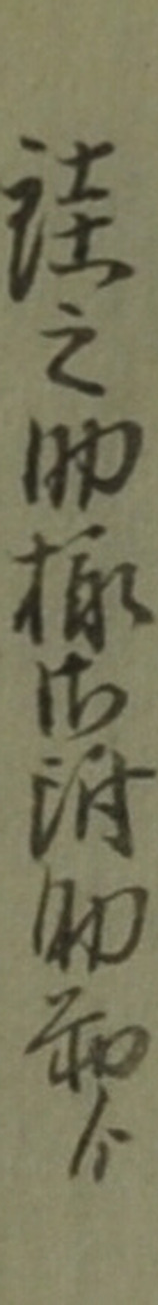詿之助様御附助勤ゟ
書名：諸御役代々録（四）
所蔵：伊那市立高遠町図書館・合同会社AMANE
